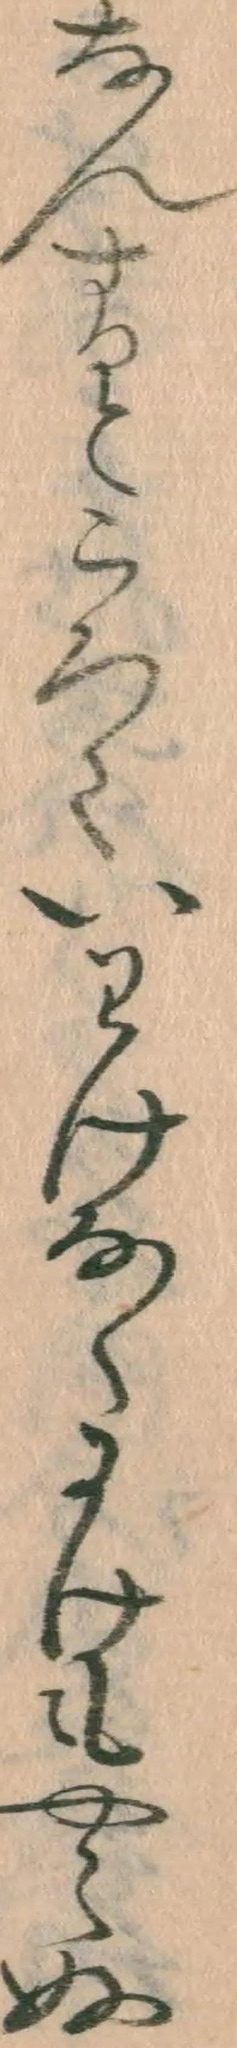なんするところにいわけなくにけもやらぬ
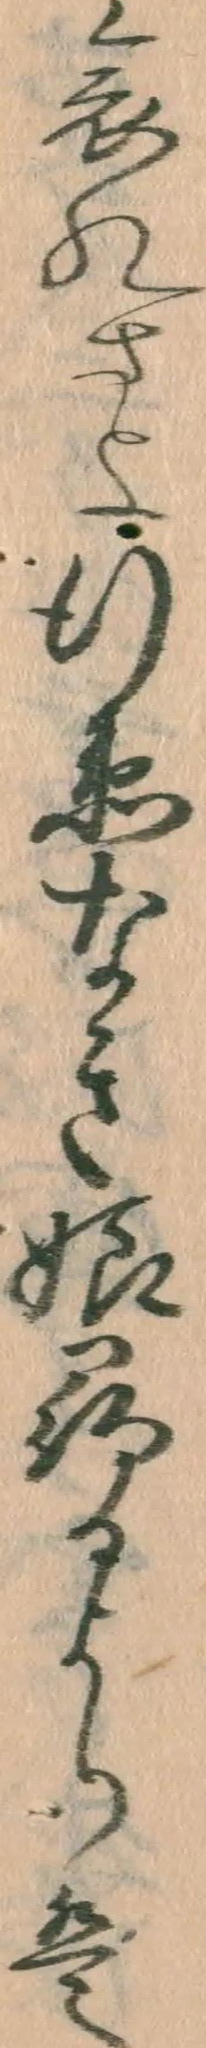哀れさよ行ゑなき娘尋るよりは
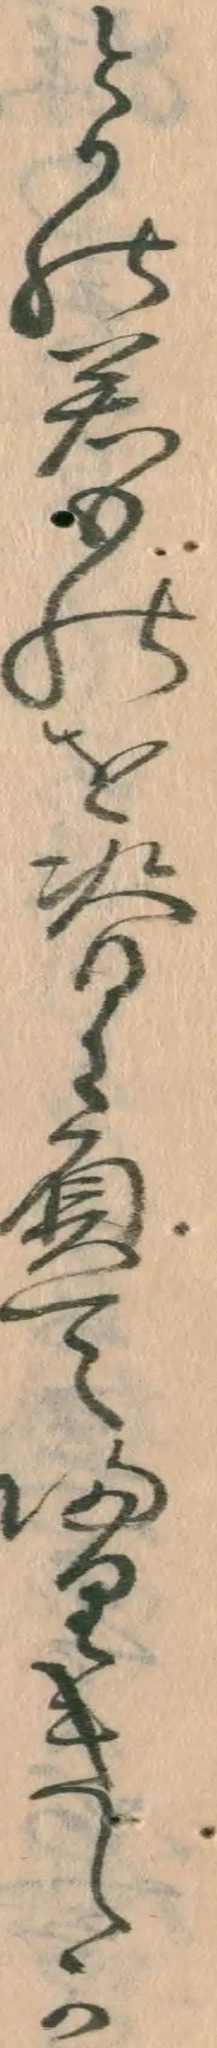とかの若ものを脊に負て帰りきしか
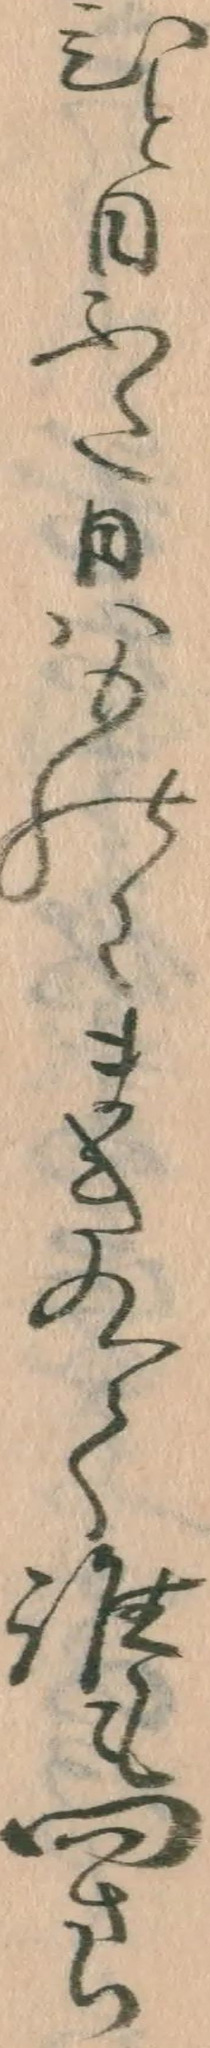ひと目ふた目ハものにまきれて誰も問さり
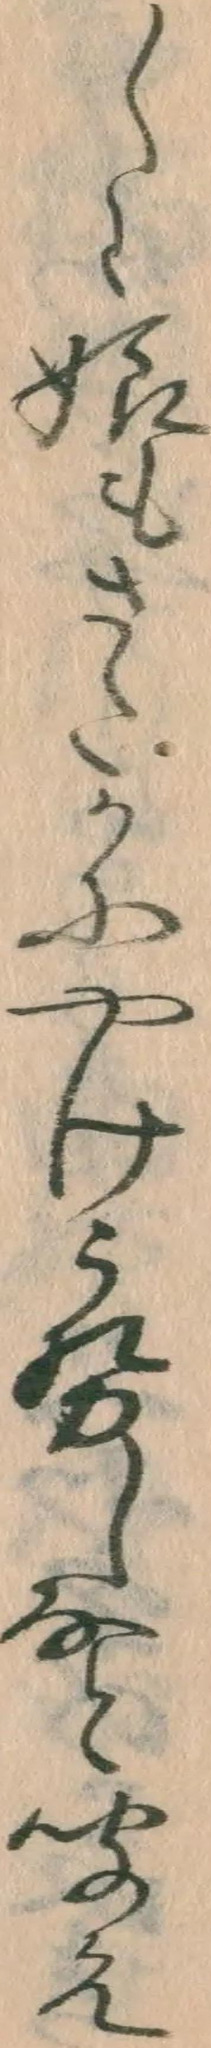しに娘もさたかにやけうせしなと聞え
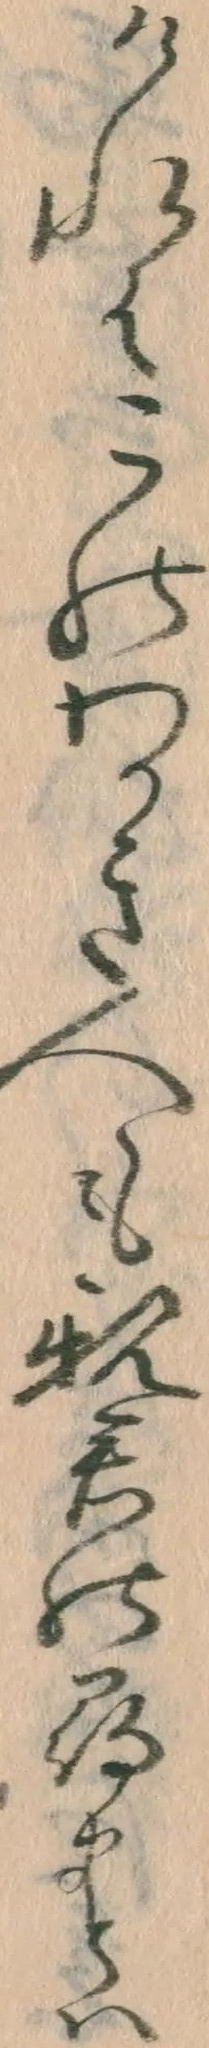けれはこのわかき人も親君の尋まとハ
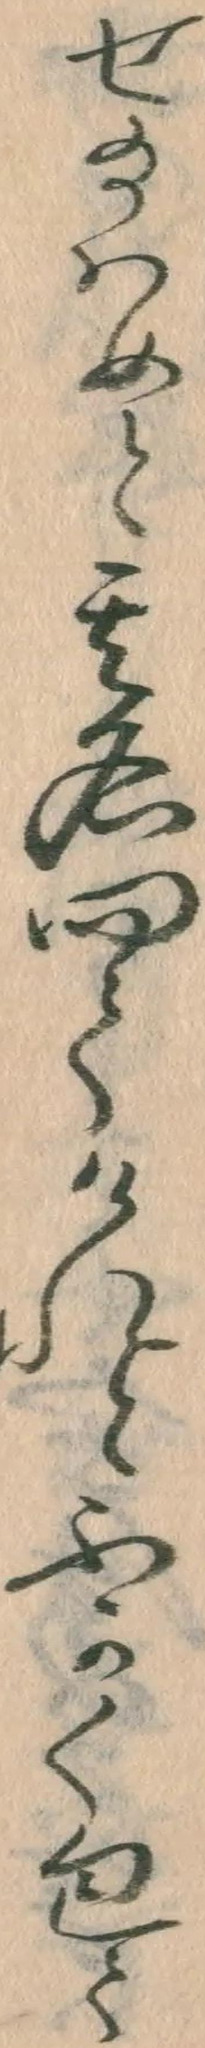せ玉ハめと其名問てけれとふかく包て
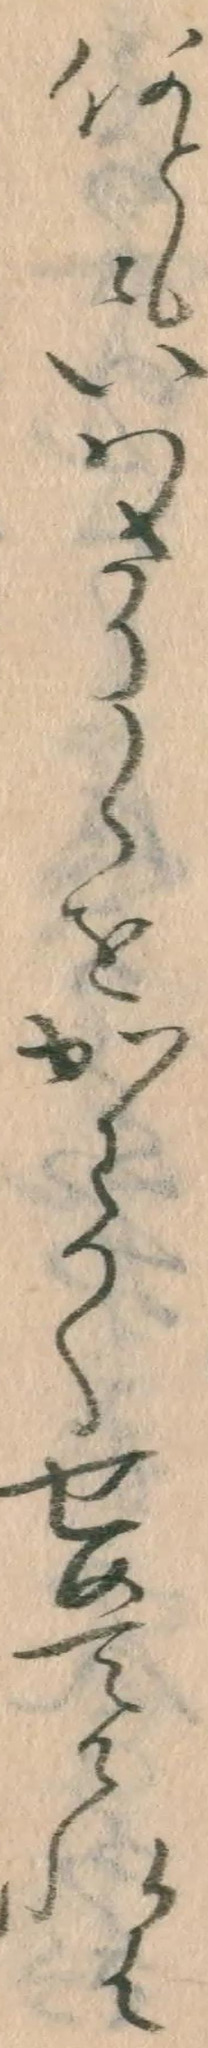何ともいハさりしをかにかくせめてけれは
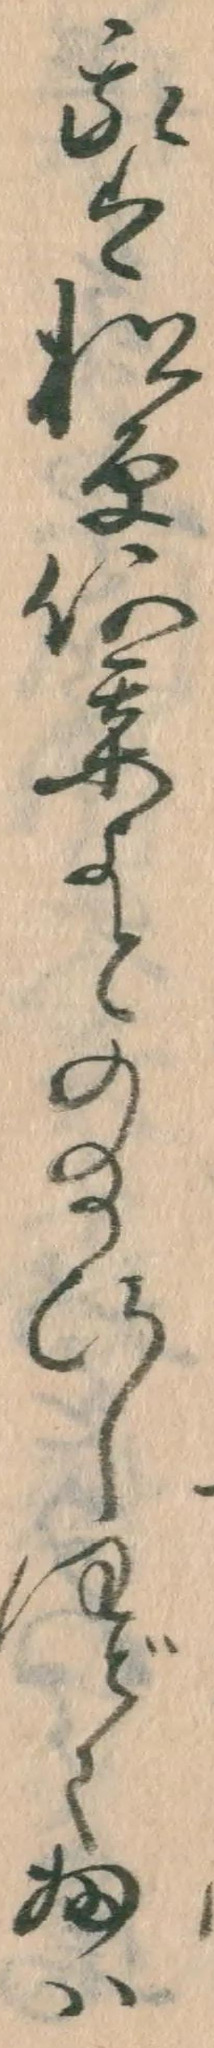我は松平何某よとの玉ひしほどに扠ハ
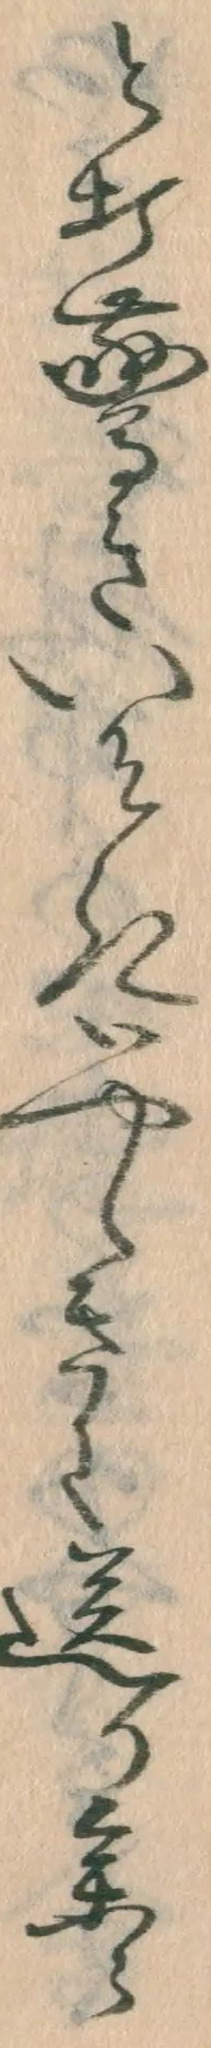と打驚きいそき御やしきに送り参ら
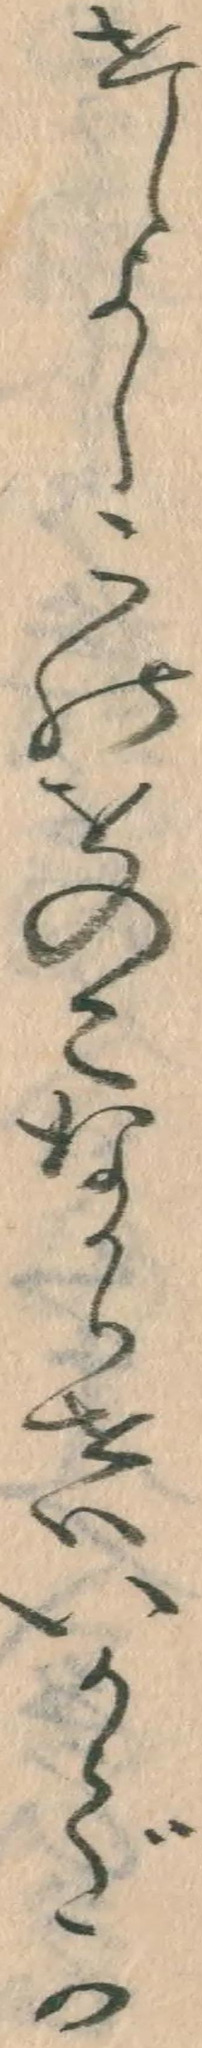せしよしこのをのこなかりせハいかでか
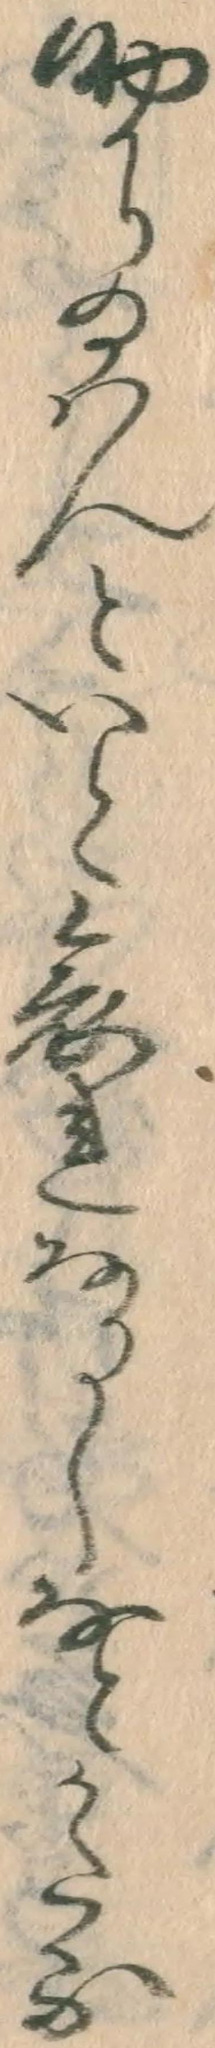助かり玉ハんといと哀れなりしなとかたる
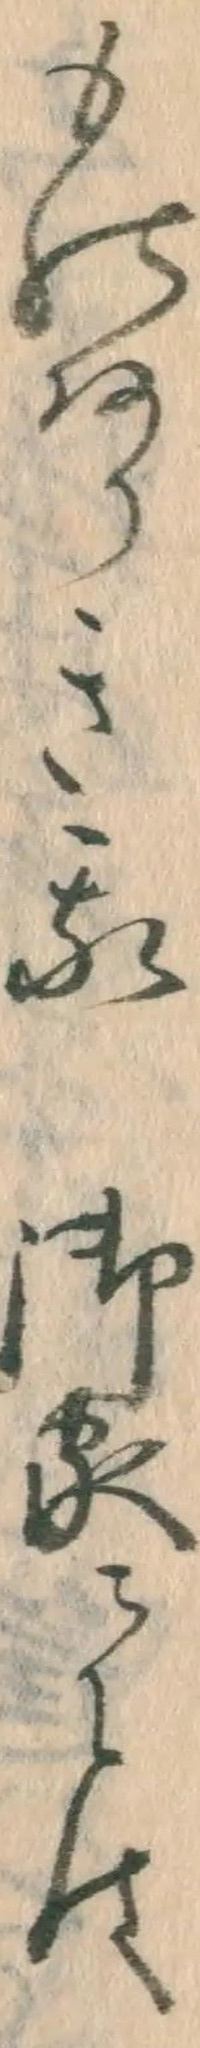ものありき我御家ニては
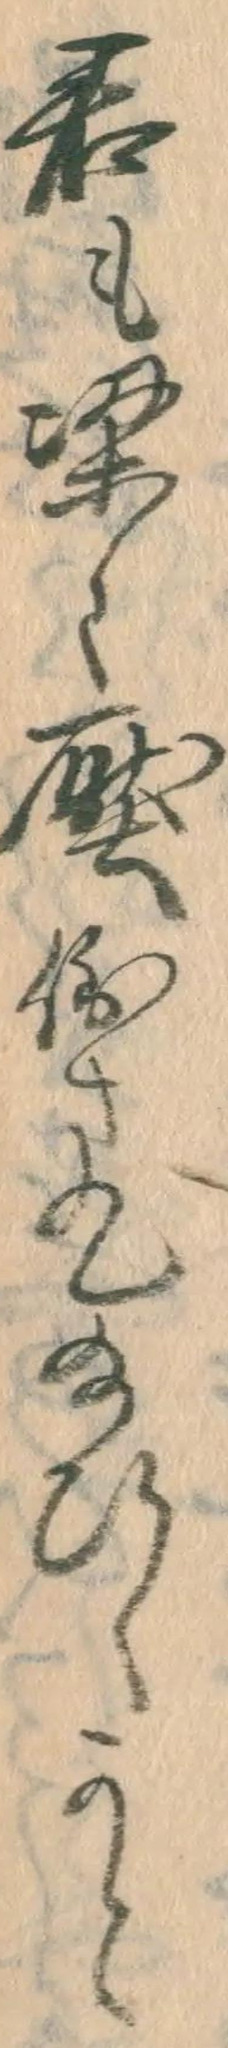君も梁に壓倒され玉ひしかと

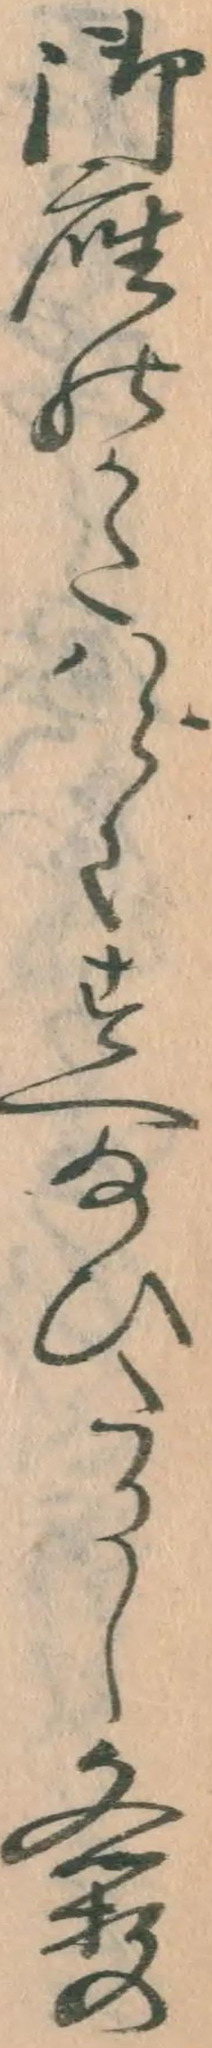御座のかたハらにすへ玉ひたりし文箱の
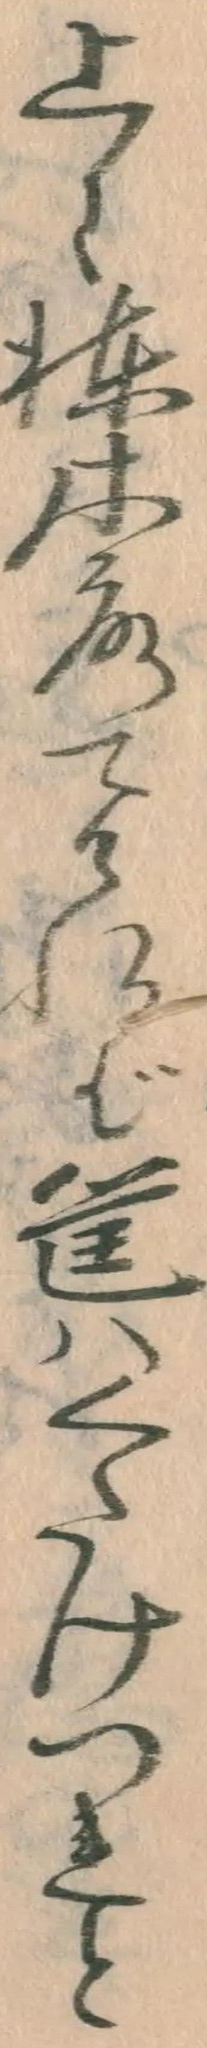上に棟木落てければ筐ハくたけつれと
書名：麗斎叢書. 20
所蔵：国立国会図書館 National Diet Library, JAPAN
